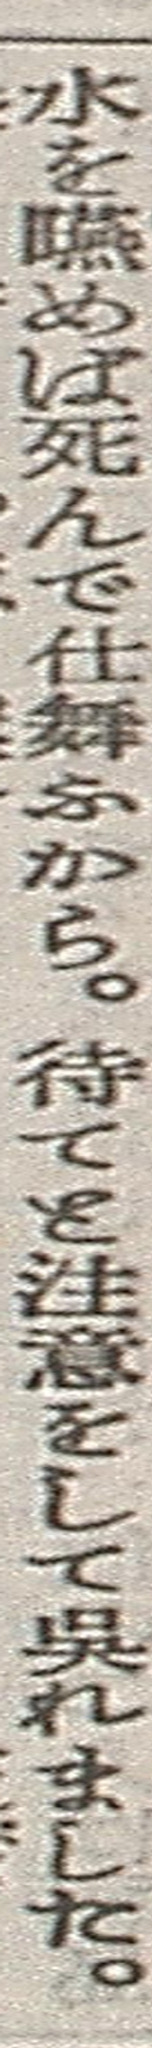水を嚥めば死んで仕舞ふから。待てと注意をして呉れました。
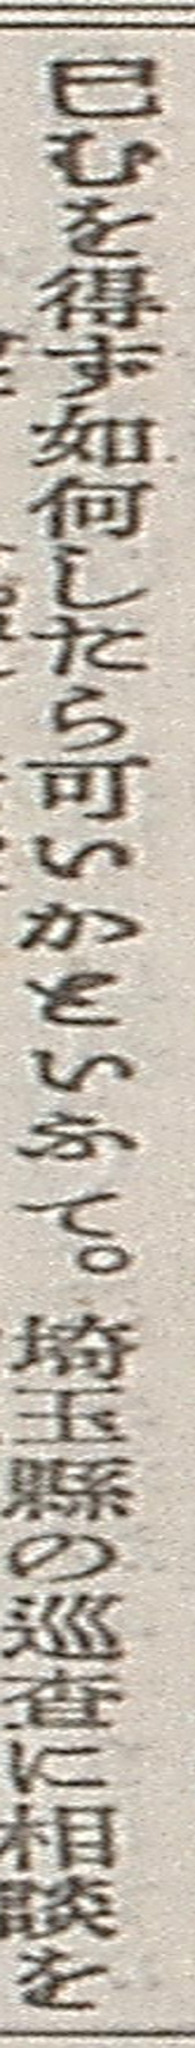已むを得ず如何したら可いかといふて。埼玉県の巡査に相談を
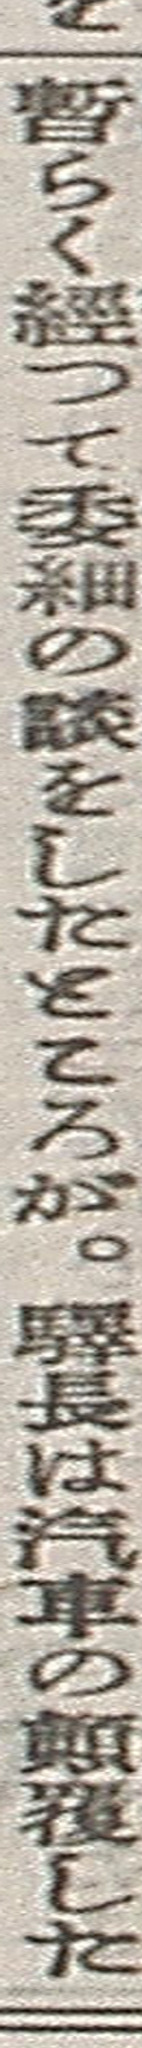暫らく経つて委細の談をしたところが。駅長は汽車の顛覆した
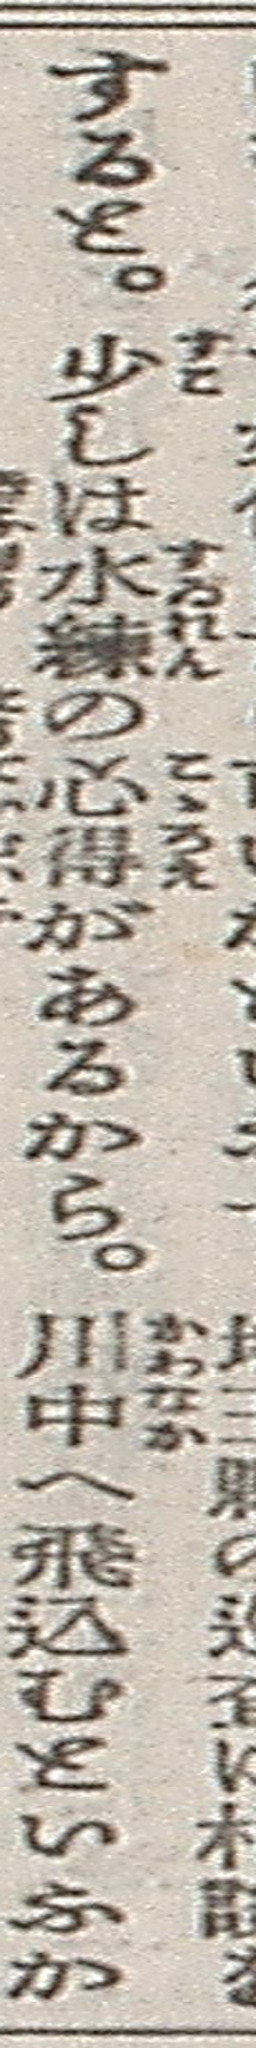すると。少しは水練の心得があるから。川中へ飛込むといふか
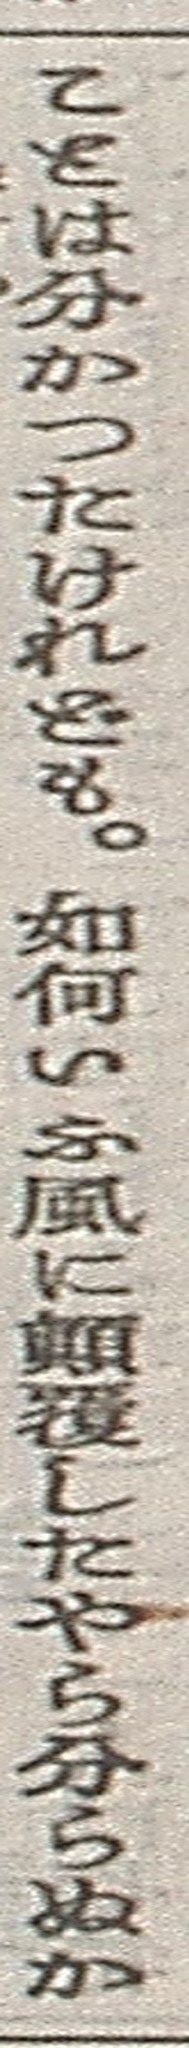ことは分かつたけれども。如何いふ風に顛覆したやら分らぬか
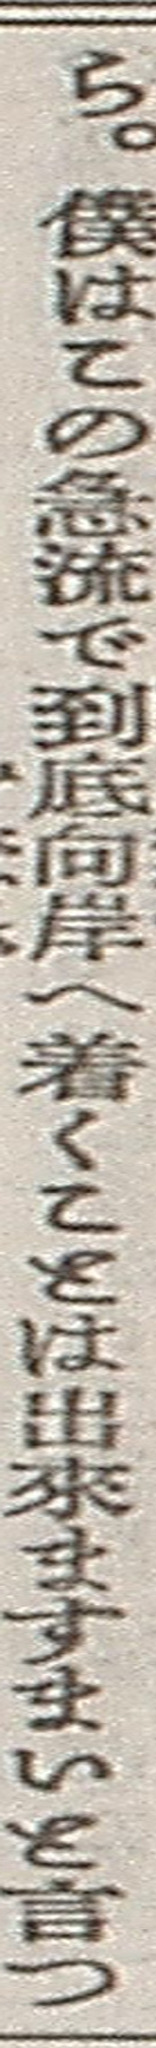ら。僕はこの急流で到底向岸へ着くことは出来ますまいと言つ
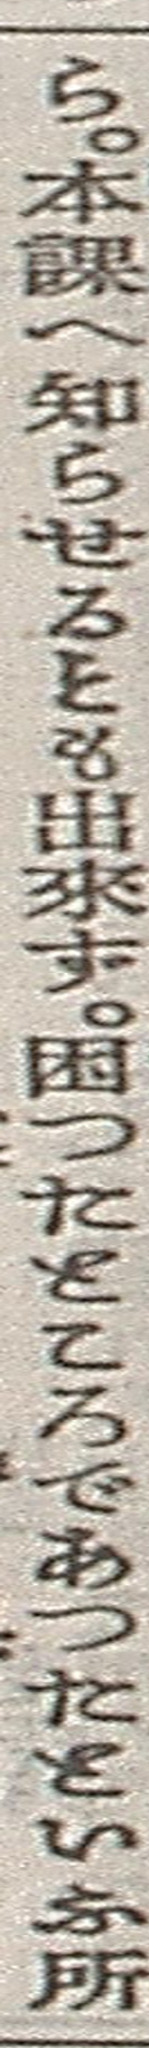ら。本課へ知らせることも出来ず。困つたところであつたといふ所
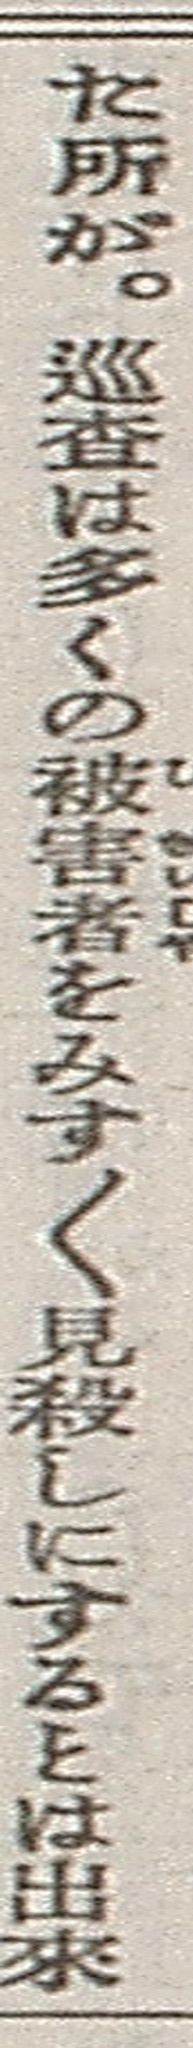た所が。巡査は多くの被害者をみす〳〵見殺しにすることは出来
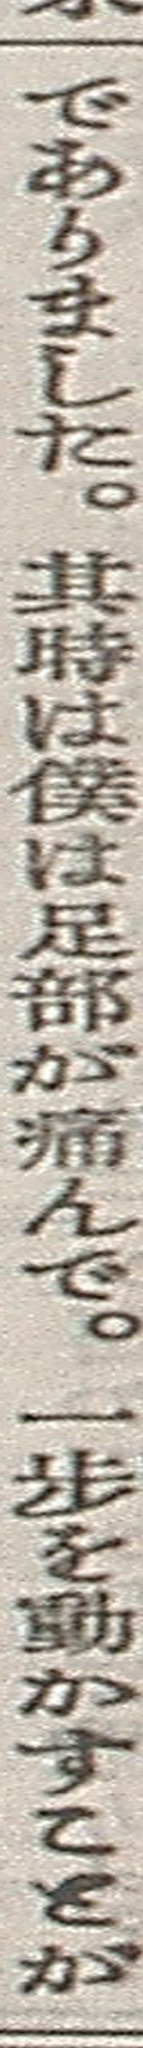でありました。其時は僕は足部が痛んで。一歩を動かすことが
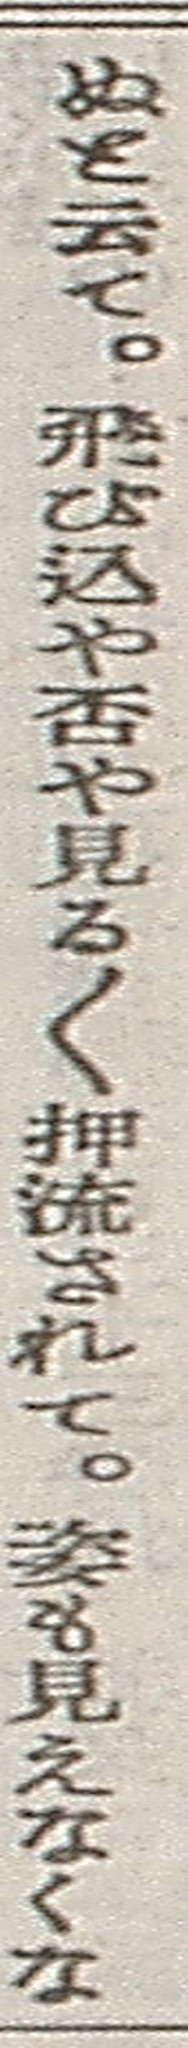ぬと云て。飛び込や否や見る〳〵押流されて。姿も見えなくな
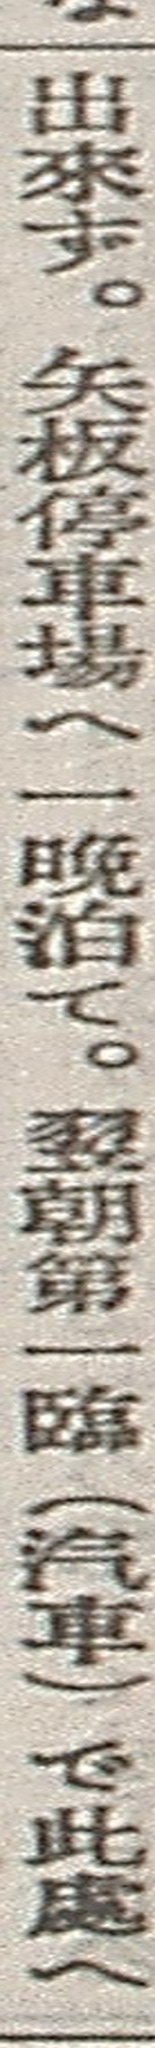出来ず。矢板停車場へ一晩泊て。翌朝第一臨で此処へ
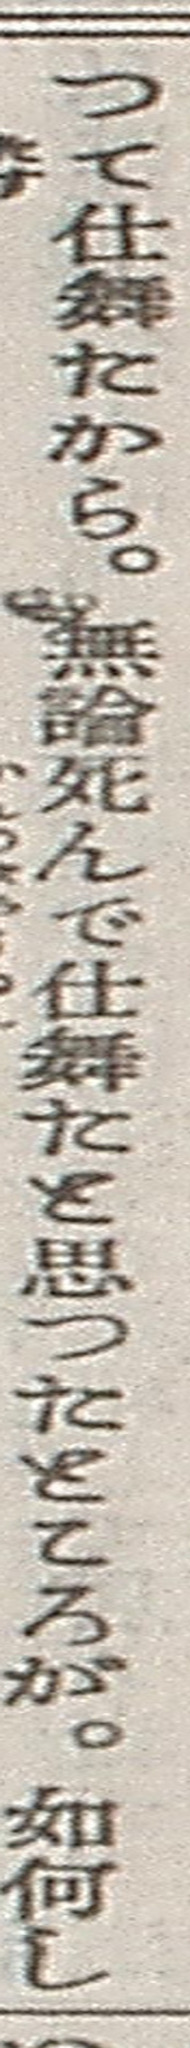つて仕舞たから。無論死んで仕舞たと思つたところが。如何し
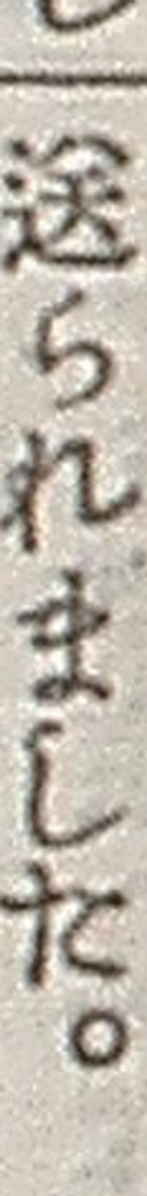送られました。
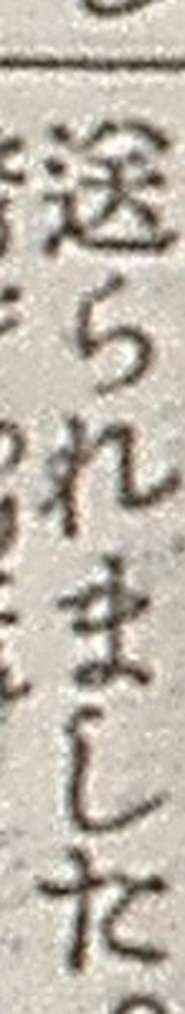送られました。
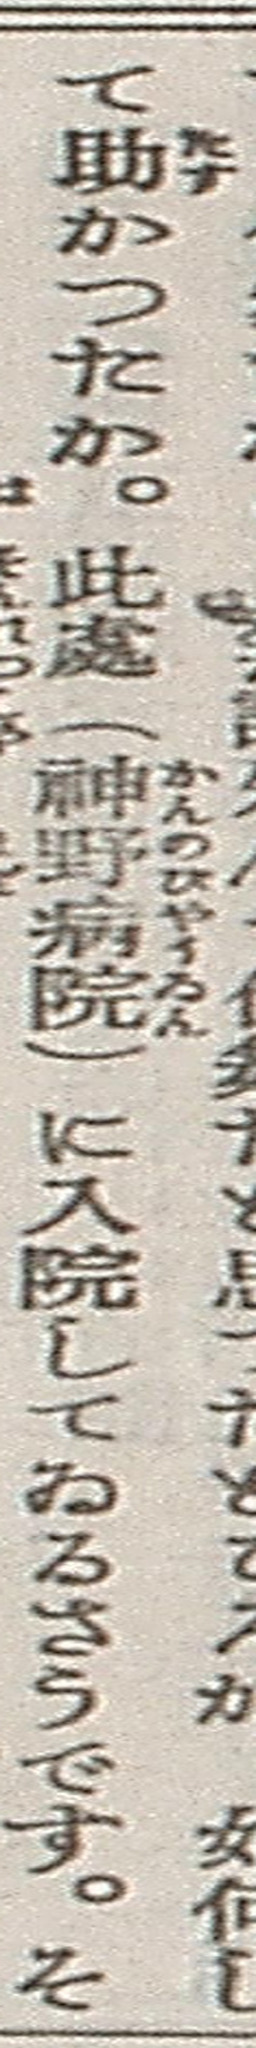て助かつたか。此処）に入院してゐるさうです。そ
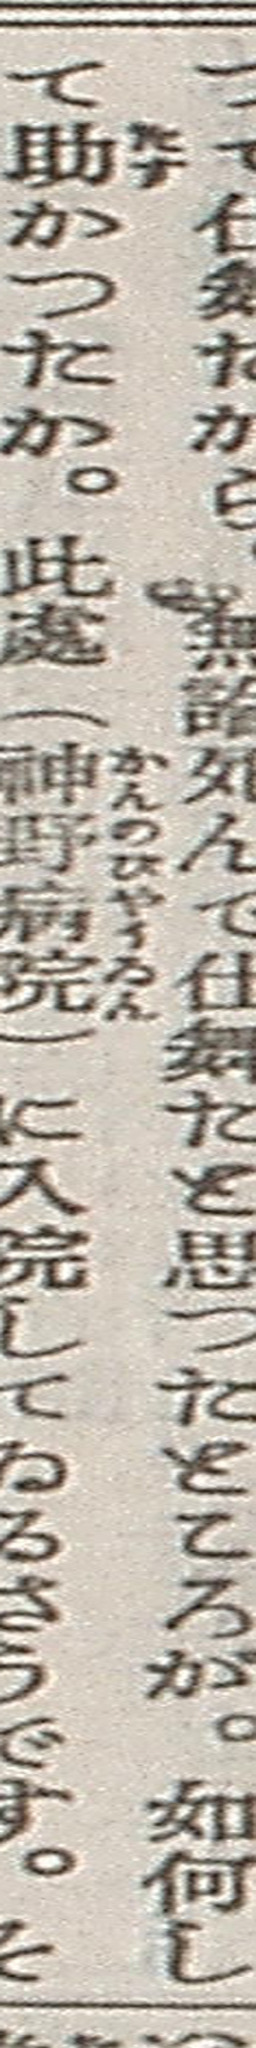て助かつたか。此処）に入院してゐるさうです。そ
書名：風俗畫報臨時増刊第百九十九號　明治三十二年十月各地災害圖會（前編之續）
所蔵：東京大学地震研究所図書室 Earthquake Research Institute Library, The University of Tokyo, JAPAN
